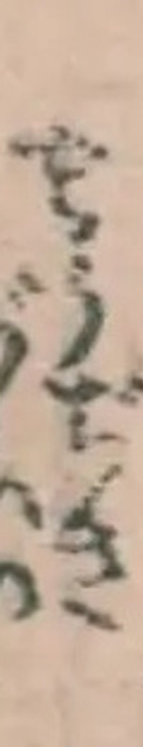せうぢき
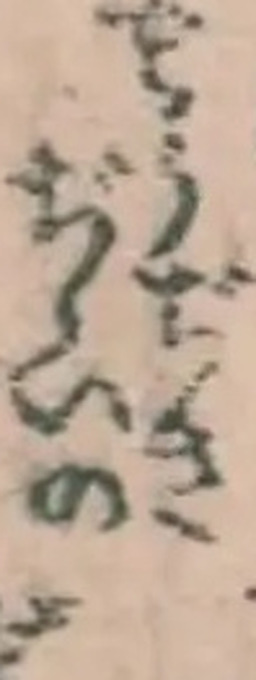ぢゝいの
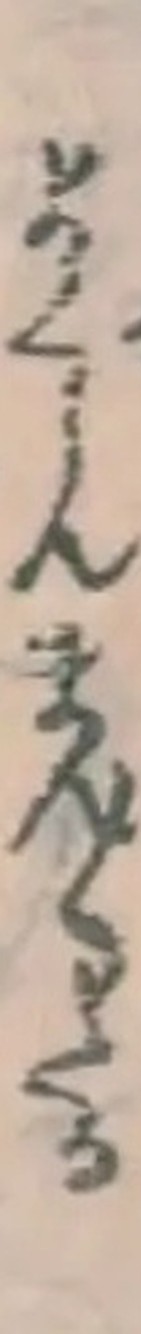よくしんまん〳〵たる
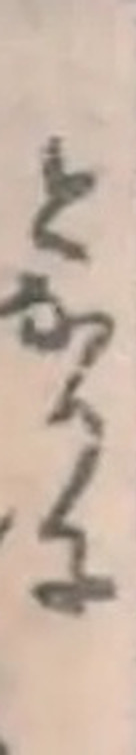となりに
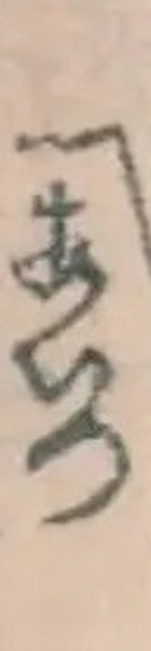〽あいつ
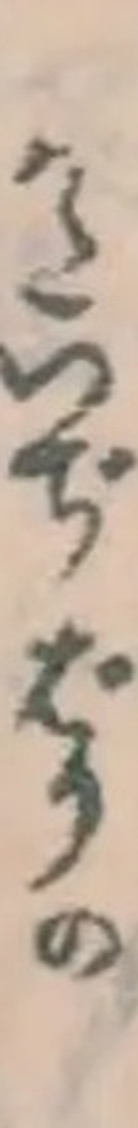かたいぢばりの
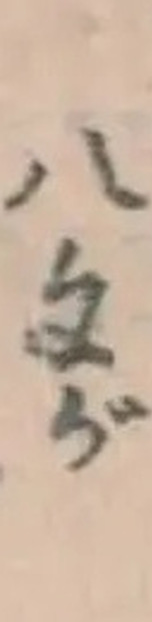八文が
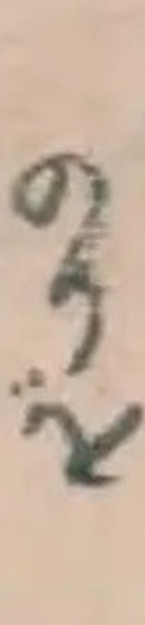のりを
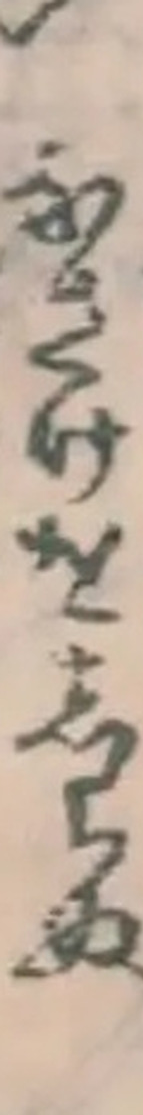なさけをしらぬ
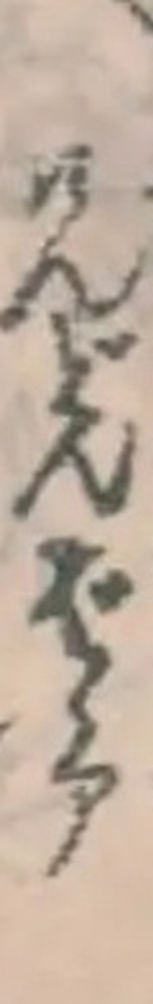けんどんばゝあ
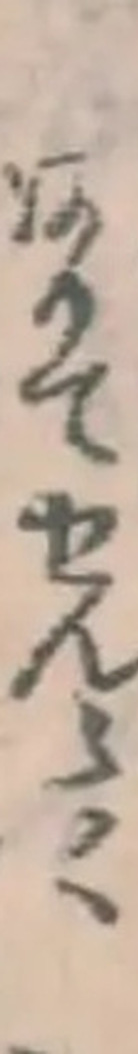ありてせんたく
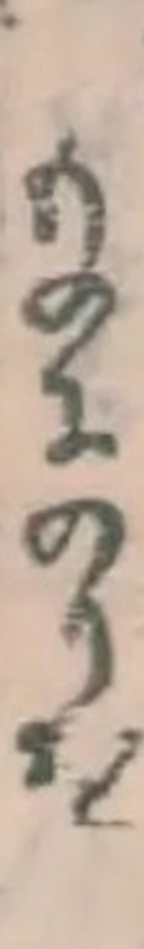ものにのりを
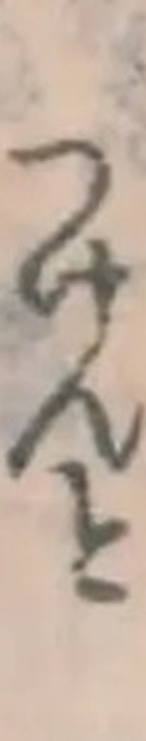つけんと
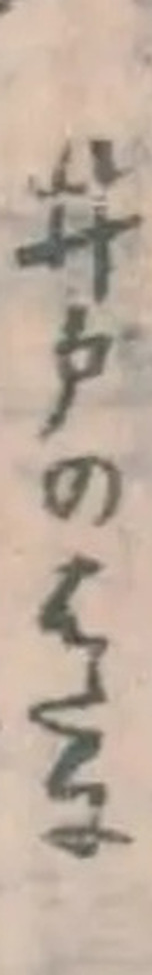井戸のはたに
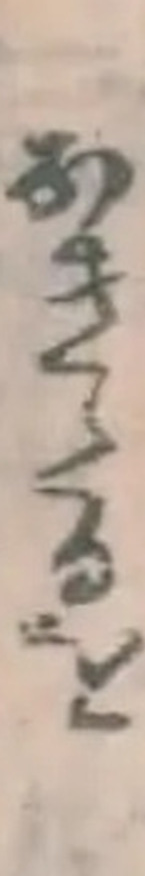おきたるを
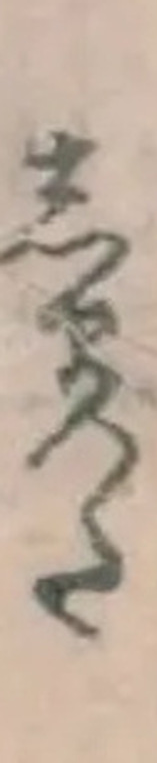しまつた
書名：舌切雀
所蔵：国立国会図書館 National Diet Library, JAPAN
